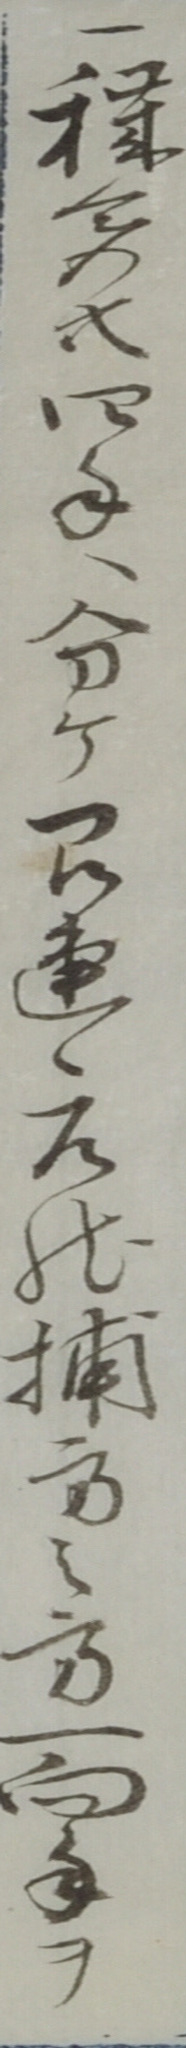一穢多共四手へ分ヶ召連候乍然捕方之方一向手ヲ
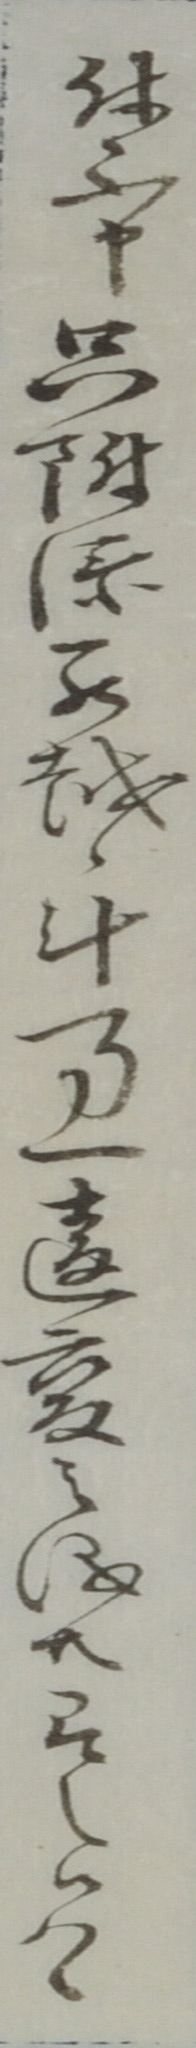付不申只附添罷越候計万一違変之儀共有之候ハヽ
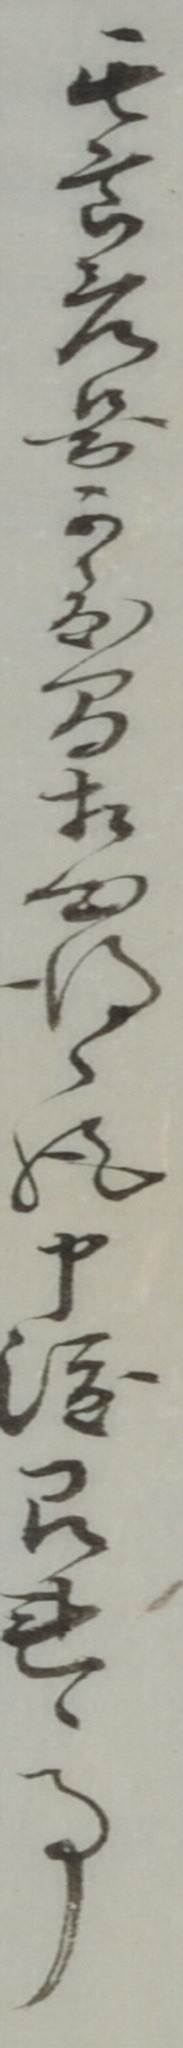其節差図可致間相心得候様申渡召連候事
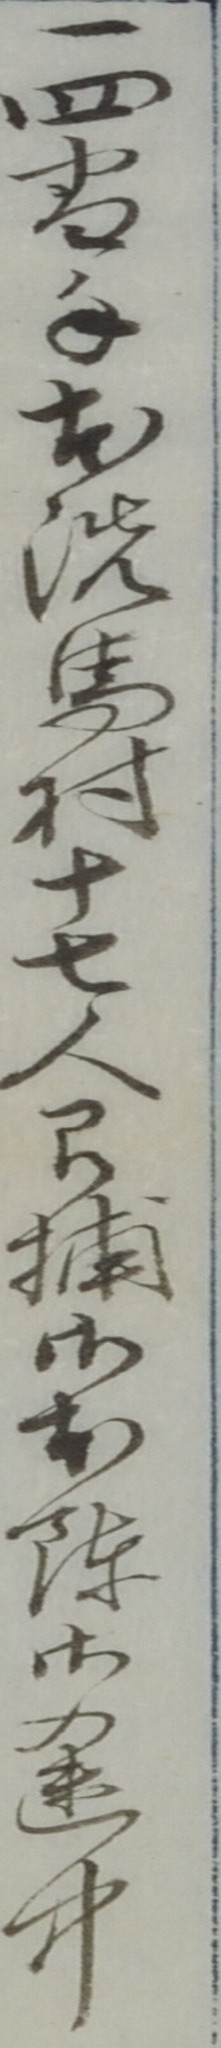一四番手本洗馬村十七人召捕御本陣御途中
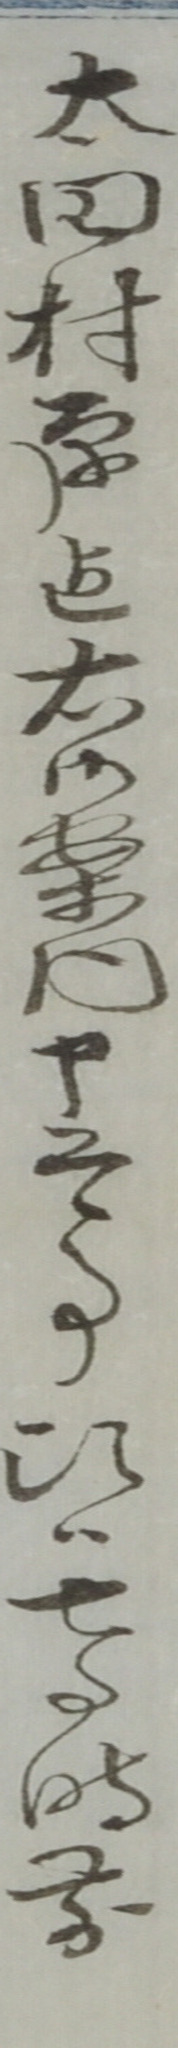太田村原迄右御案内申上候事頃ハ七事時前
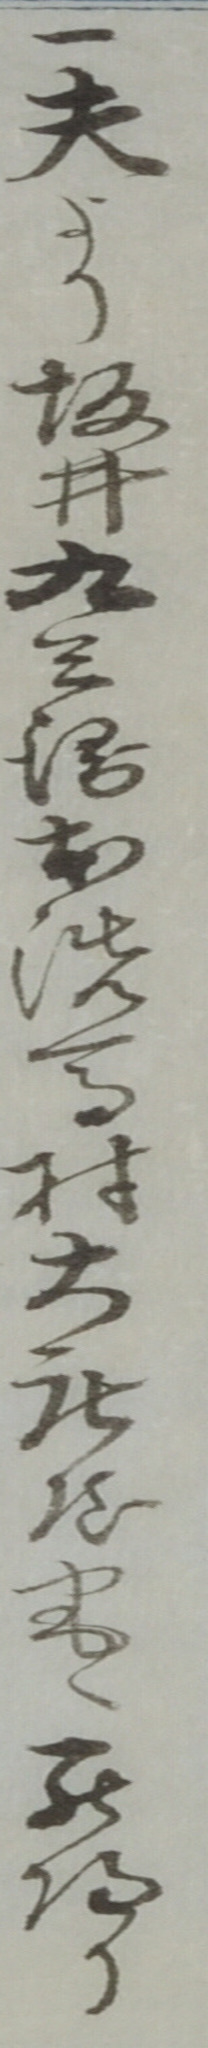一夫より坂井九兵衛本洗馬村大庄屋宅へ罷帰り
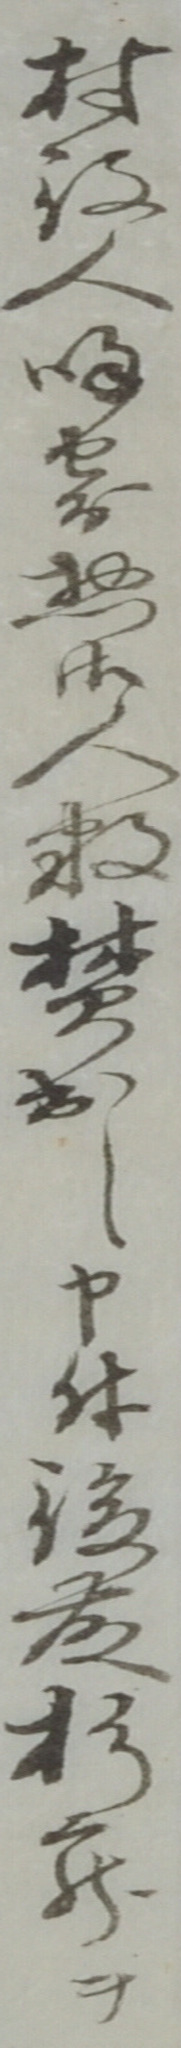村役人呼寄惣御人数焚出し申付後藤杉蔵ヲ
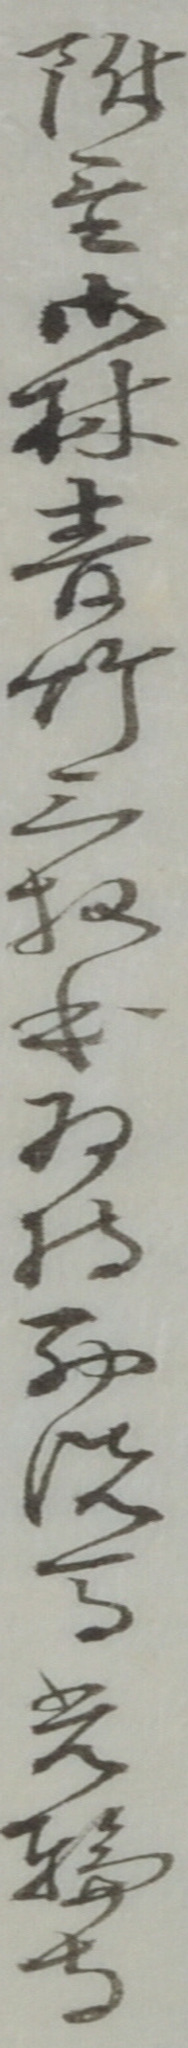附置御林青竹三拾本為持西洗馬光輪寺
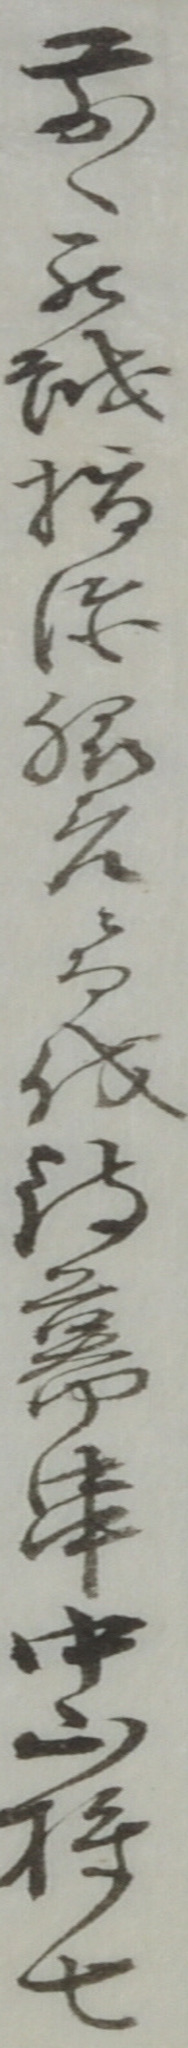前へ罷越指添脇差に而伐致幕串中山権七
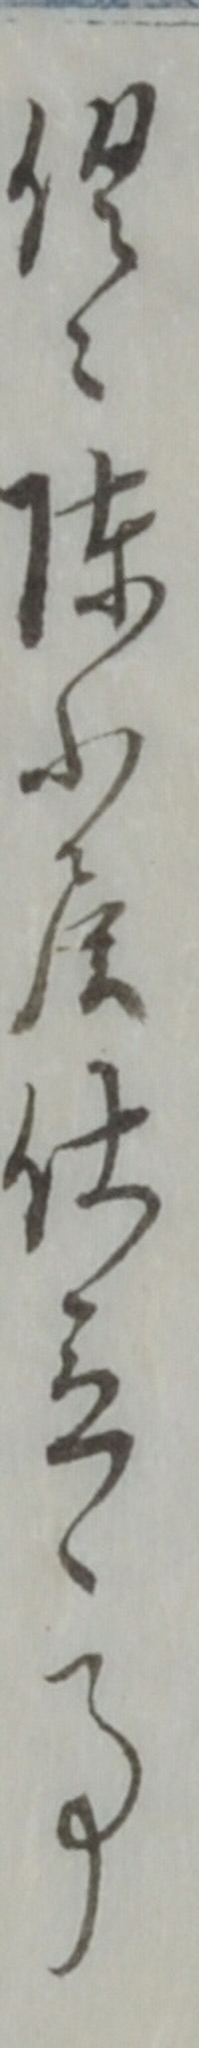倶々陣小屋仕立候事

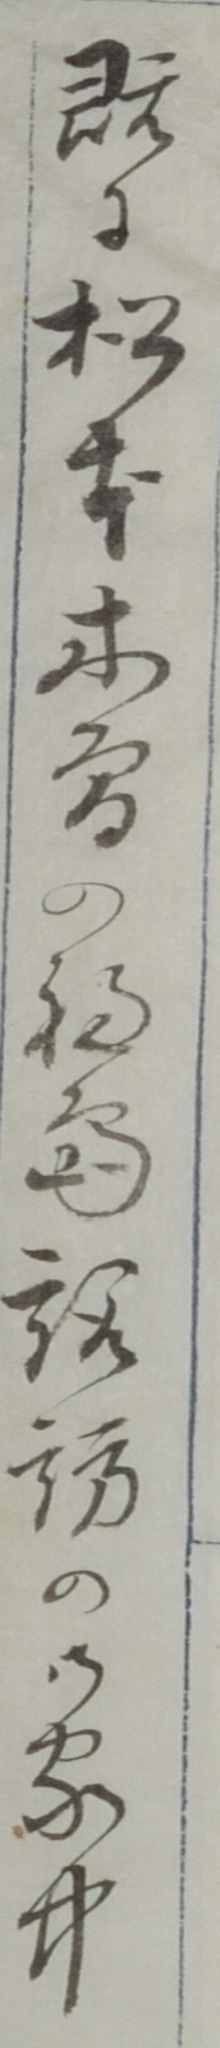既に松本木曽の福島諏訪の御家中
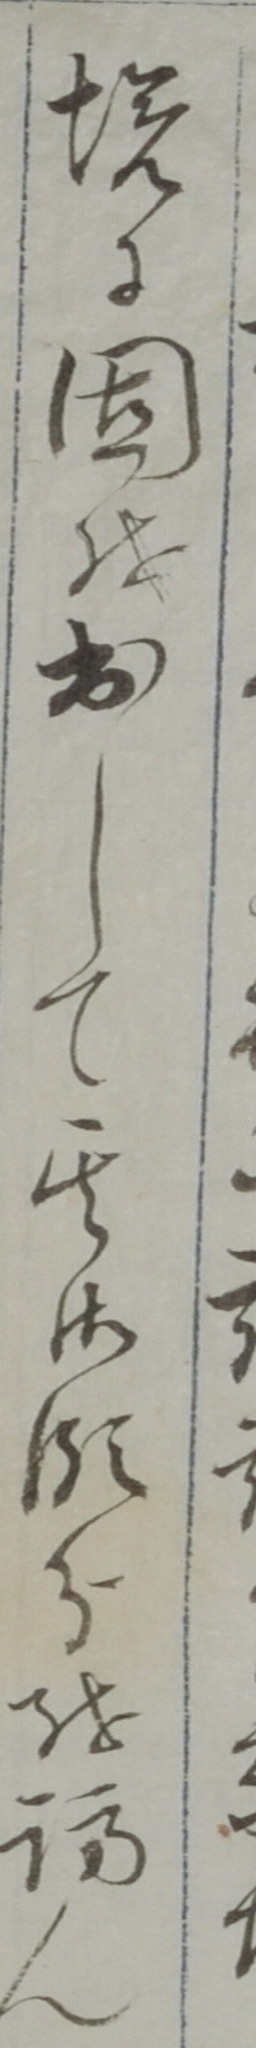境に固を出して其御領分を訪ん
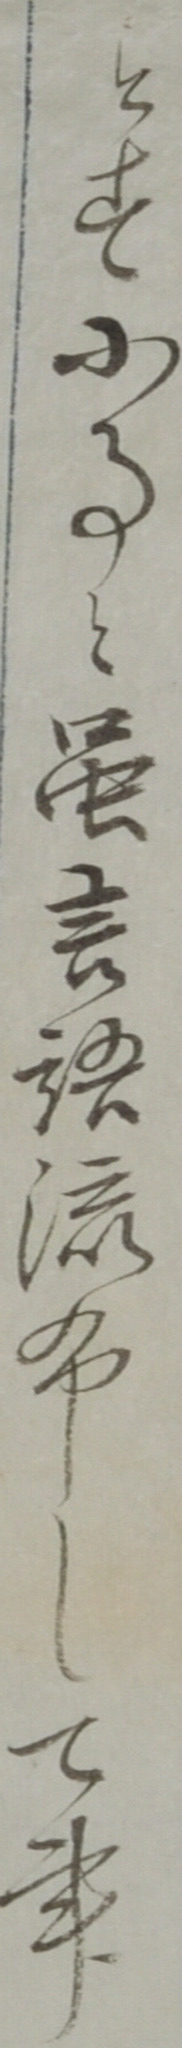とす小事と雖言語流布して事
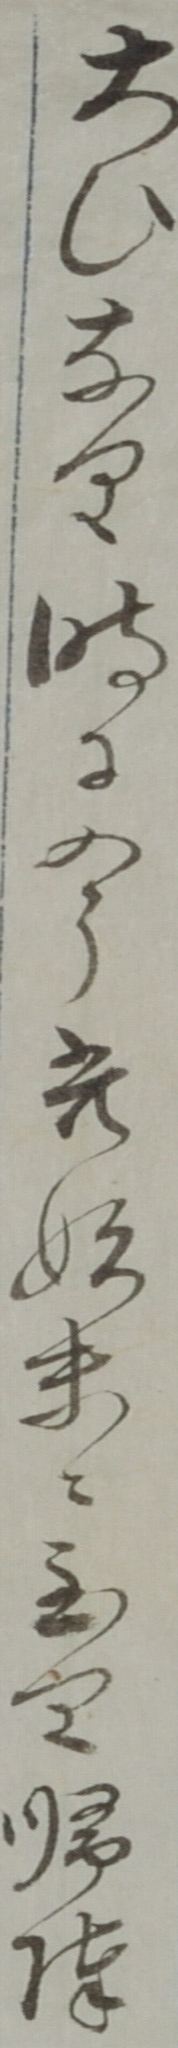大ひなり時に今此始末に至り帰陣
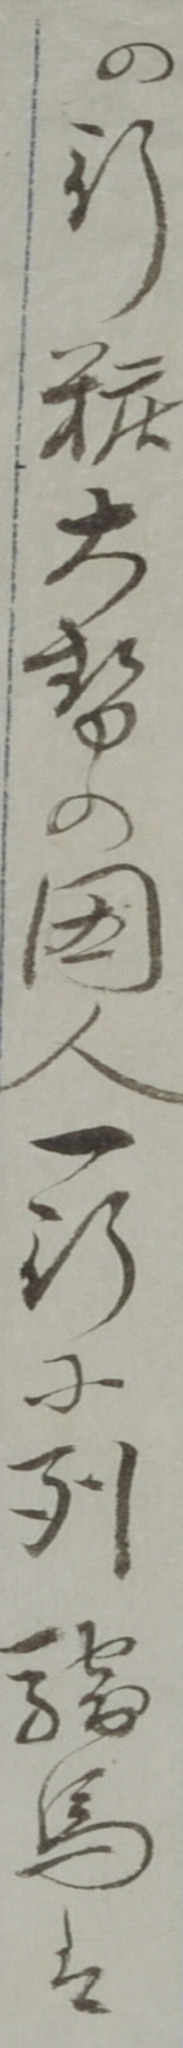の行粧大勢の囚人一行に列騎馬は
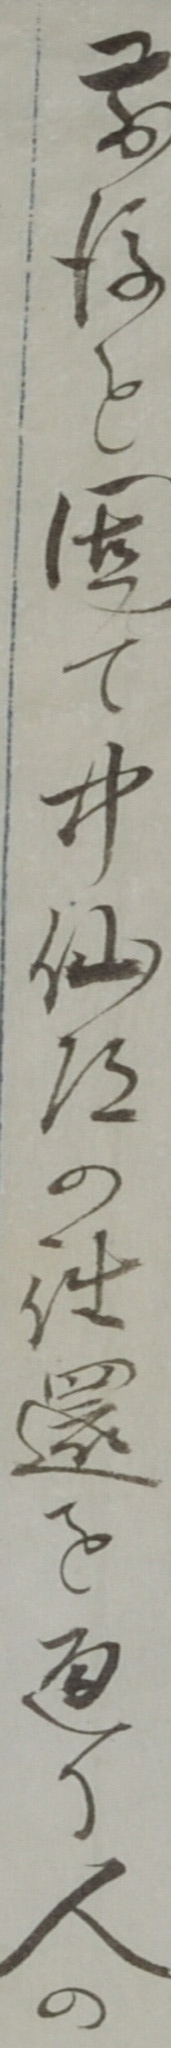前後を固て中仙道の往還を通り人の
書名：高遠領洗馬騒動一件抜書
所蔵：伊那市立高遠町図書館・合同会社AMANE
